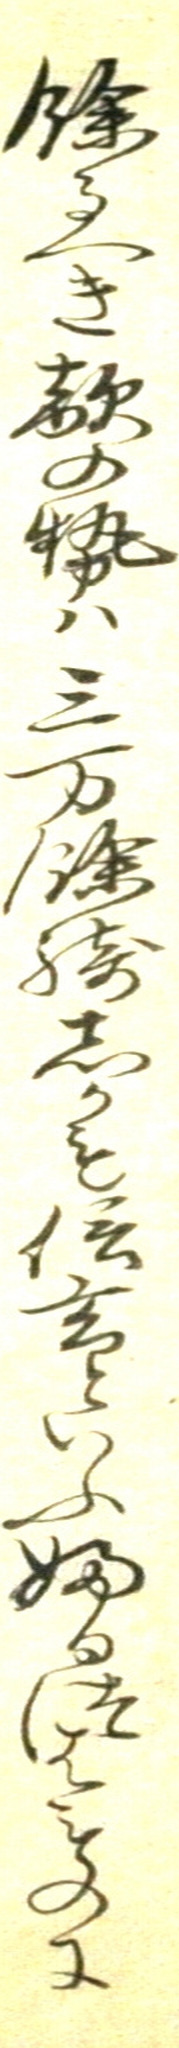余るへき敵の勢は三万余騎しかも信玄といふふるつはものに
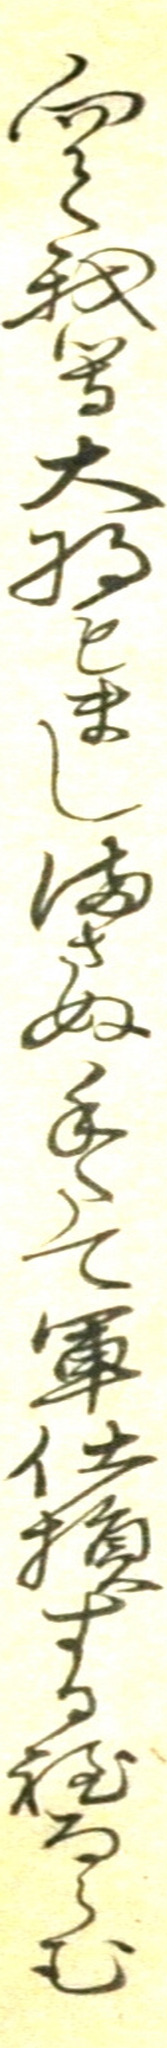向て我等大将もましまさぬ手たて軍仕損する程ならむ
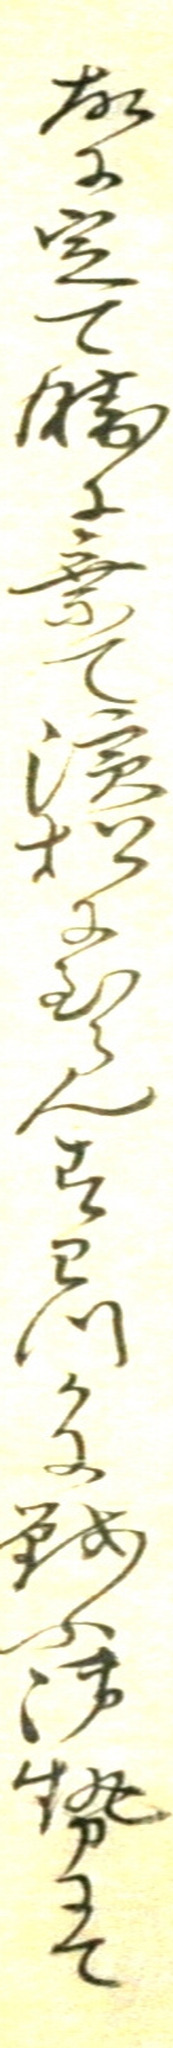故に定て勝に乗て浜松に至らんすわつかに戦ふ御勢にて
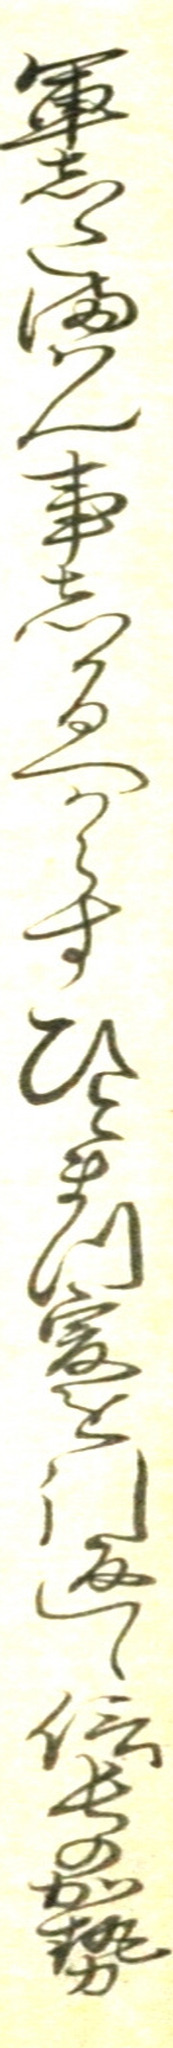軍したまはん事しかるへからすひとまつ爰を引返し信長の加勢
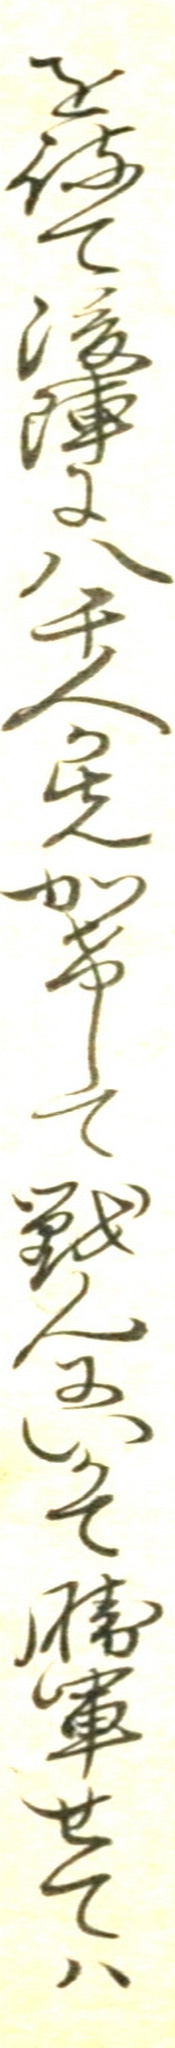を待て後陣に八千人か先かけして戦んにいかて勝軍せては
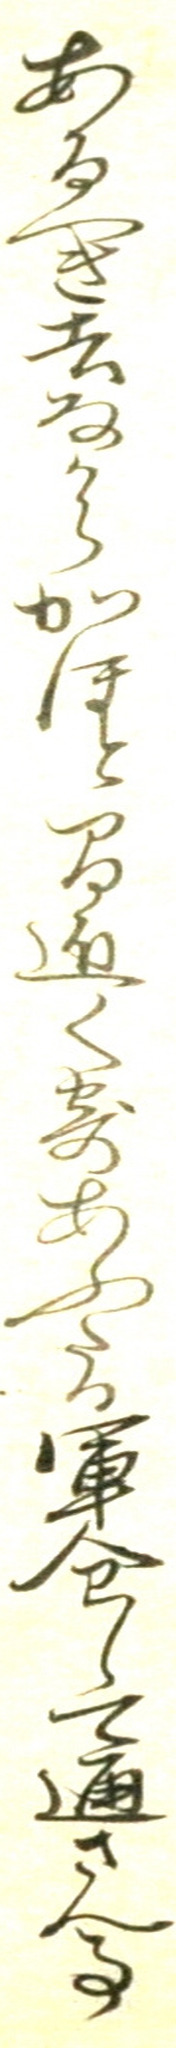あるへき去なからかほと間近く寄あふたる軍分して通さん事
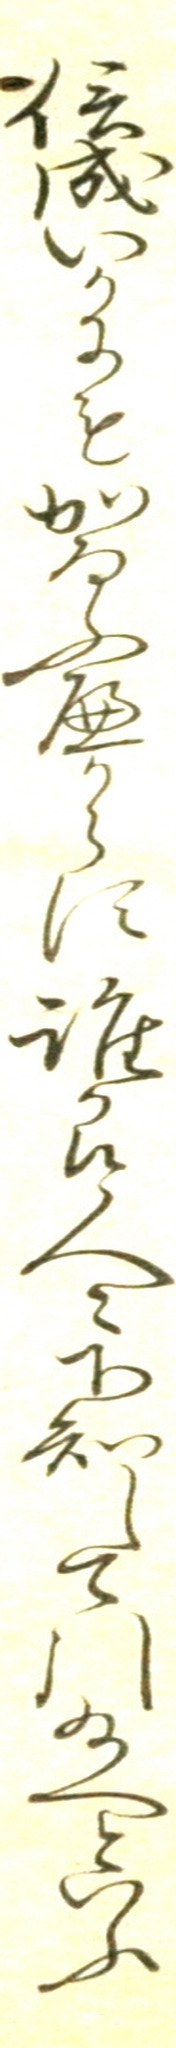信成いかにもかなふへからす誰か候人々下知して引給へといふ
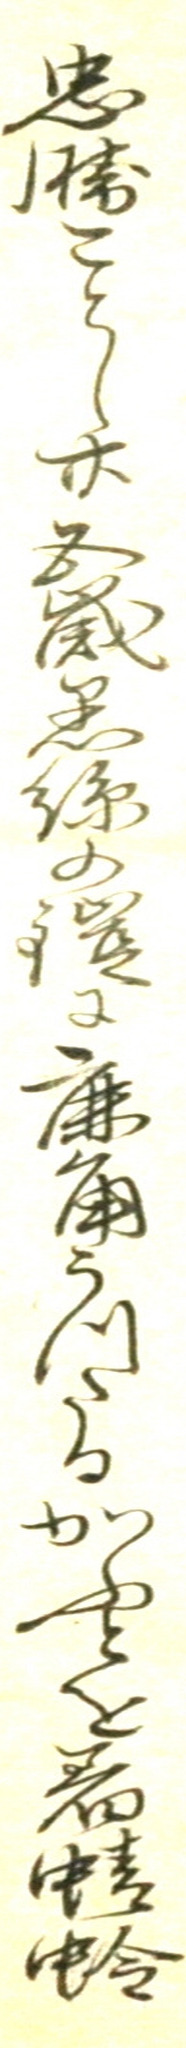忠勝ことし廿五歳黒糸の鎧に鹿角うつたるかふとを着蜻蛉
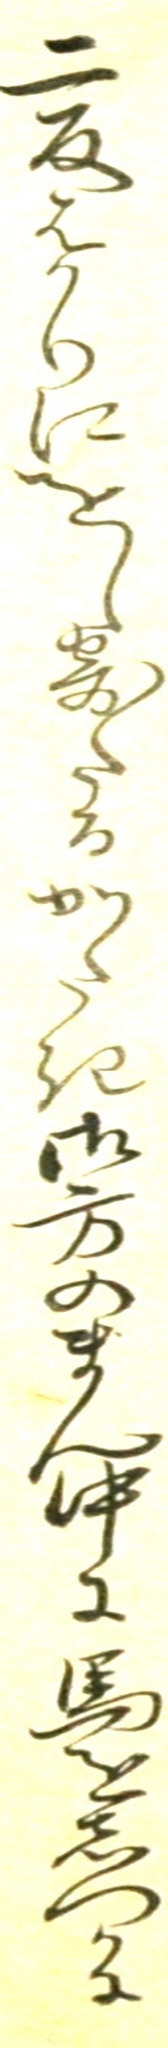二反はかりにをし寄たるかたき御方のまん中に馬をしつかに
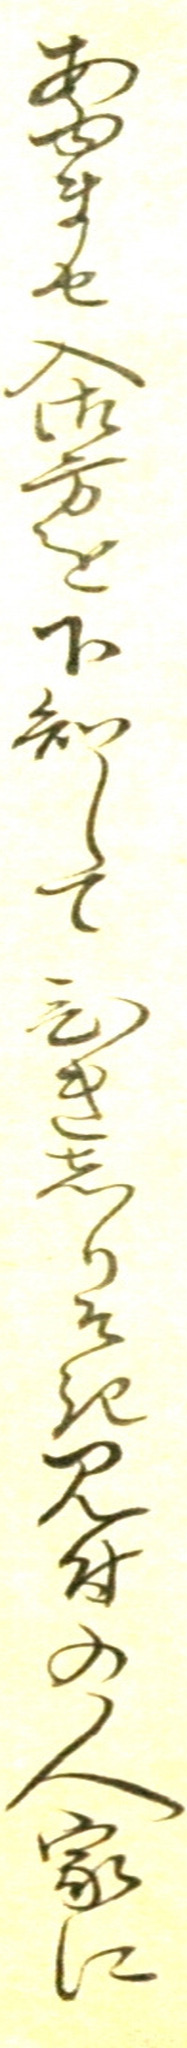あゆませ入御方を下知してひきしりそき見付の人家に

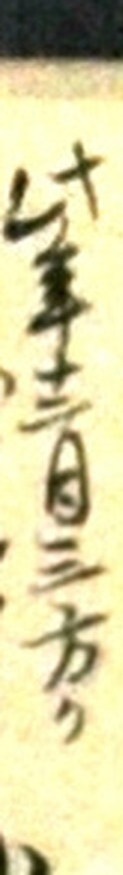此年十二月三方か
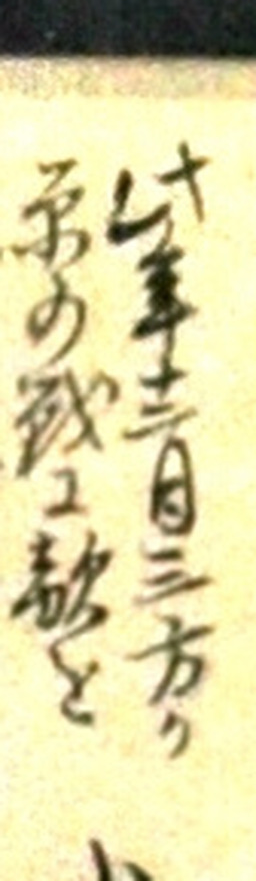原の戦に敵を
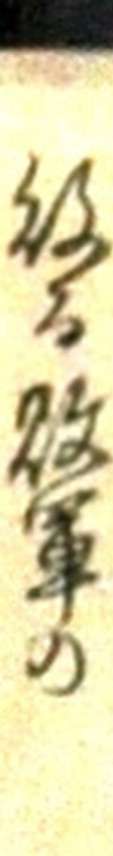敗る敗軍の
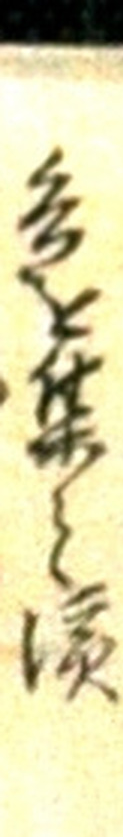兵を集て浜
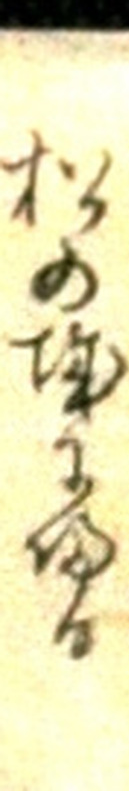松の城に帰る
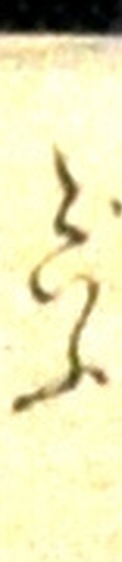といふ
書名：藩翰譜（四・上）
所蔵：伊那市立高遠町図書館・合同会社AMANE
